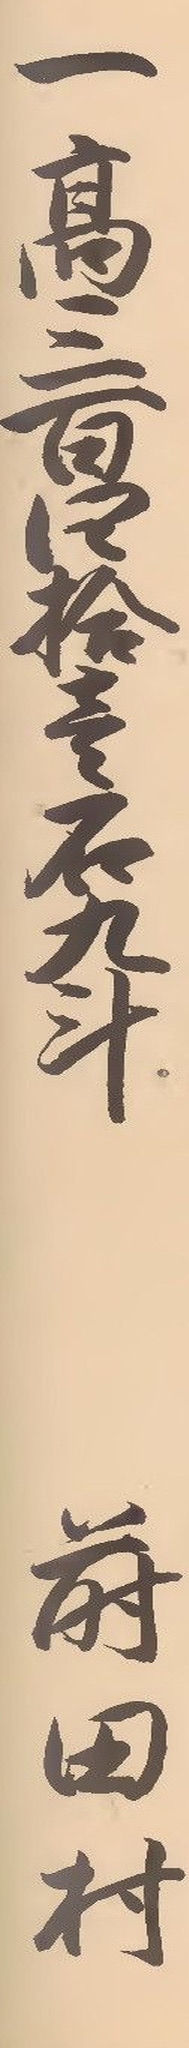一高三百四拾壱石九斗蒔田村
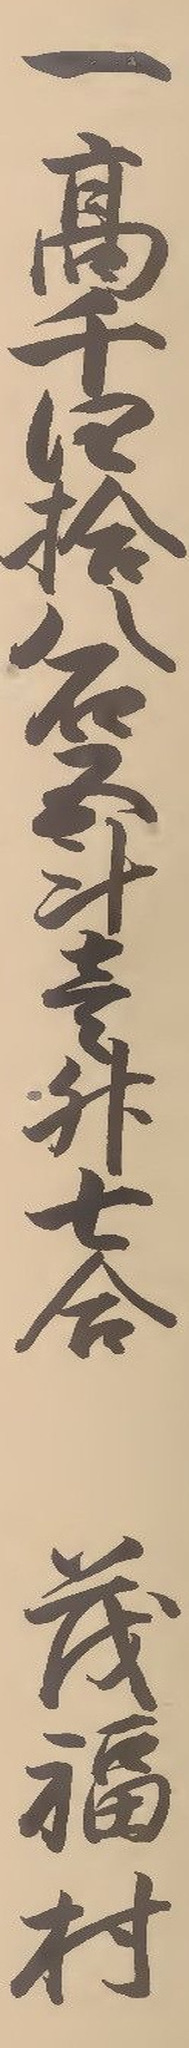一高千四拾八石五斗壱升七合茂福村

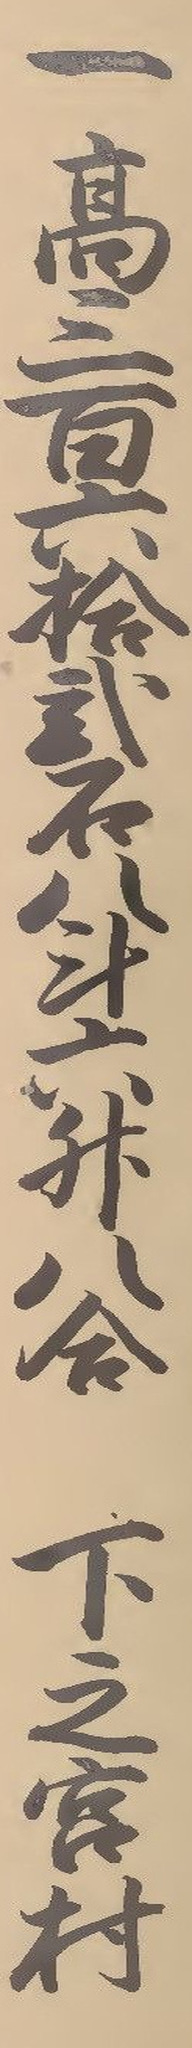一高三百六拾弐石八斗六升八合下之宮村
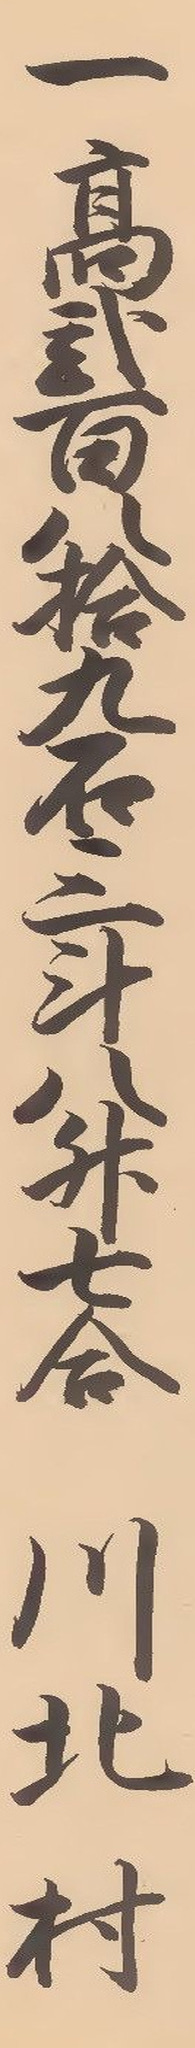一高弐百八拾九石三斗八升七合川北村
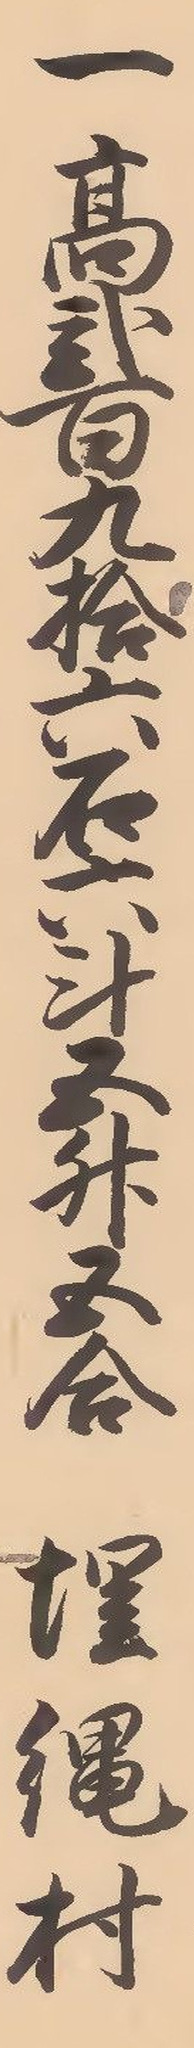一高弐百九拾六石六斗五升五合埋縄村

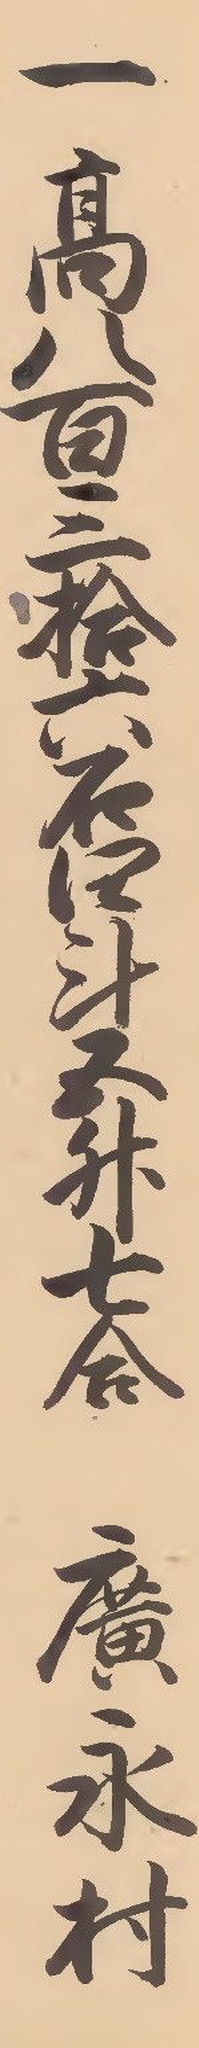一高八百三拾六石四斗五升七合広永村
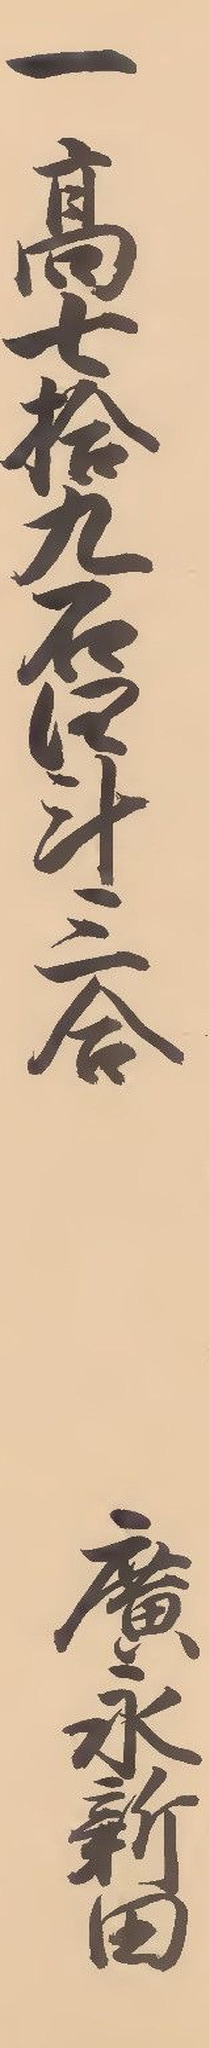一高七拾九石四斗三合広永新田
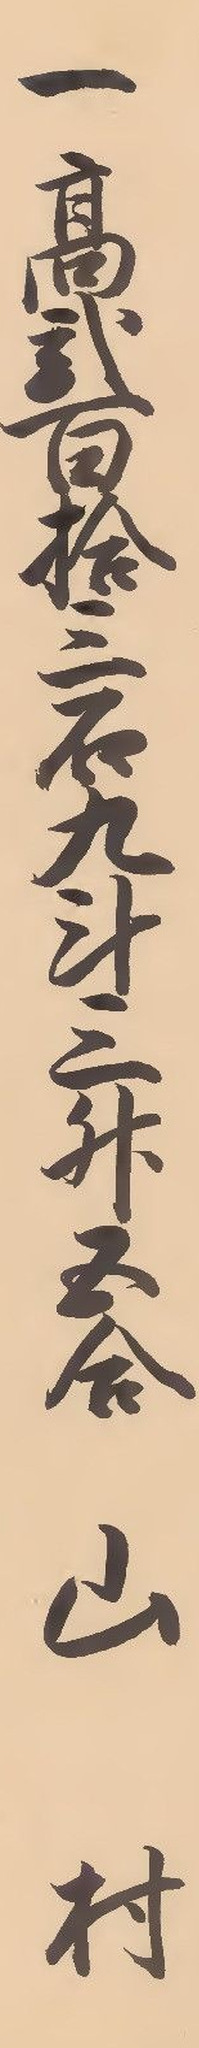一高弐百拾三石九斗三升五合山村
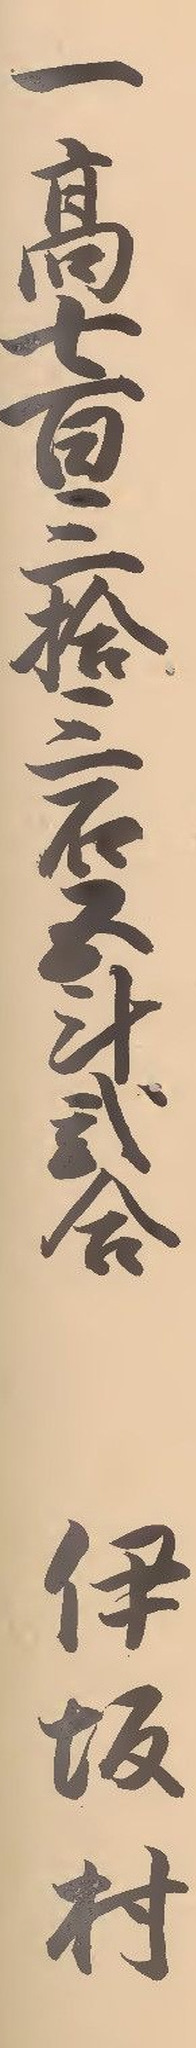一高七百三拾三石五斗弐合伊坂村
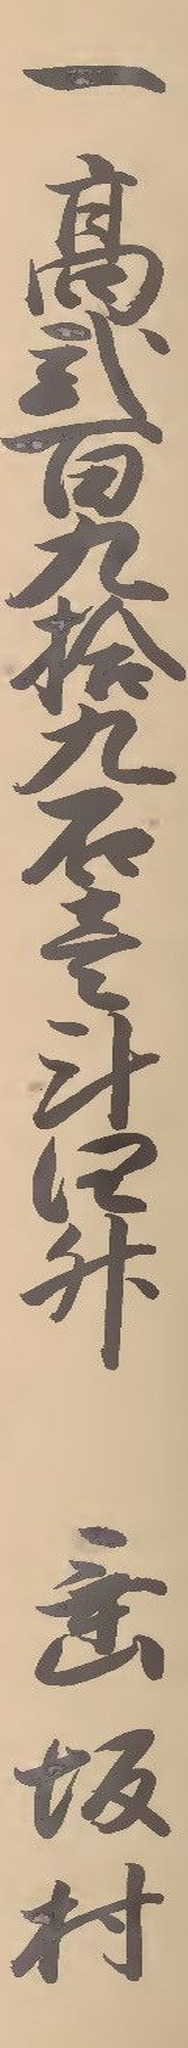一高弐百九拾九石壱斗四升垂坂村
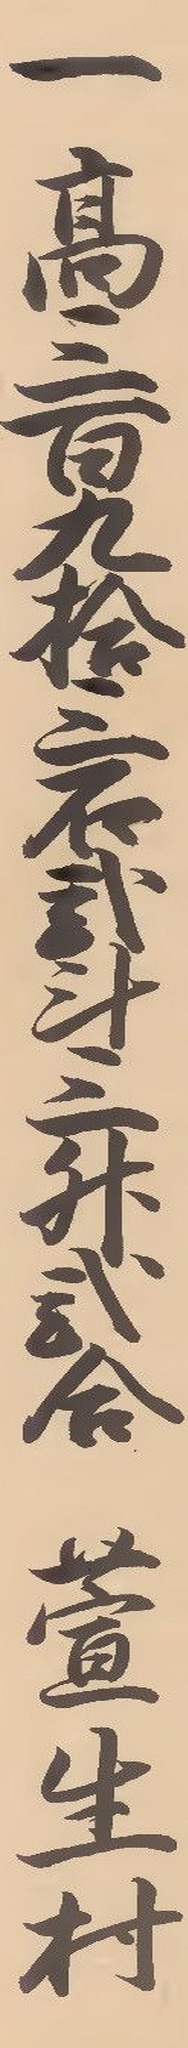一高三百九拾三石弐斗三升弐合萱生村

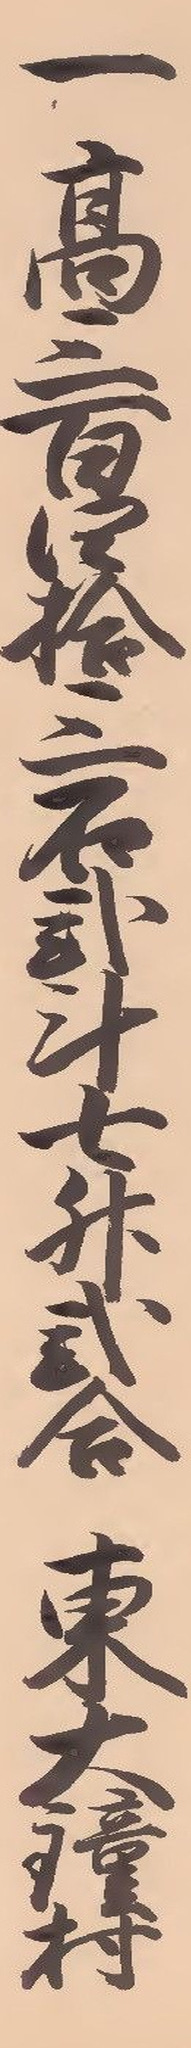一高三百四拾三石弐斗七升弐合東大鐘村

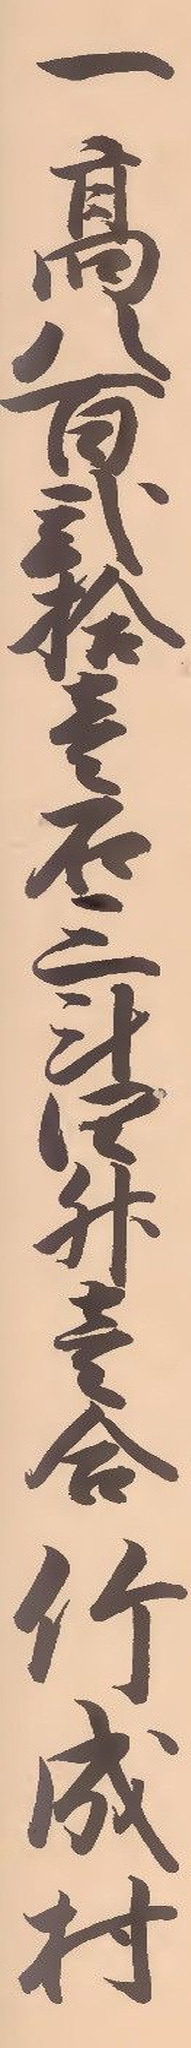一高八百弐拾壱石三斗四升壱合竹成村
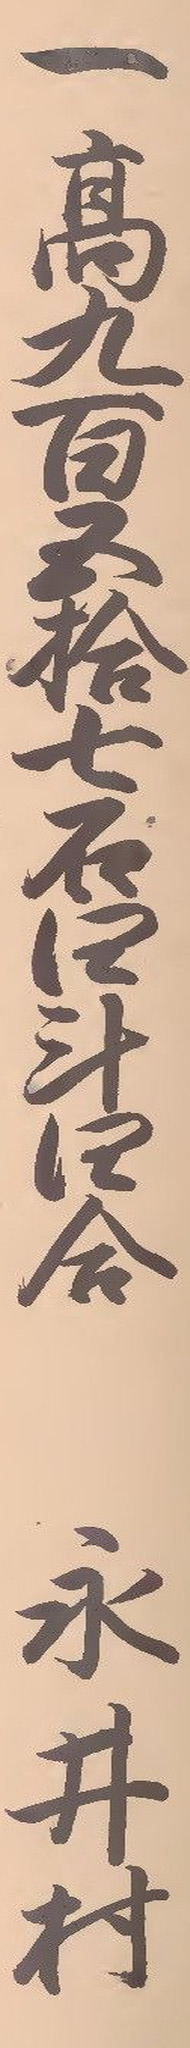一高九百五拾七石四斗四合永井村
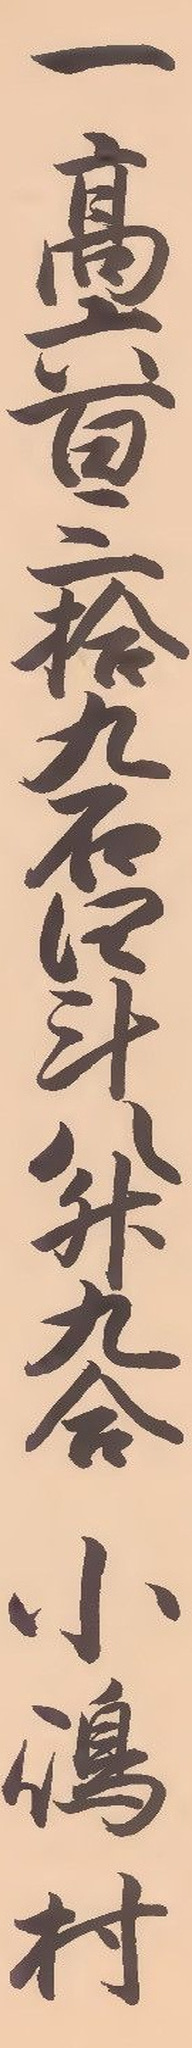一高六百三拾九石四斗八升九合小嶋村
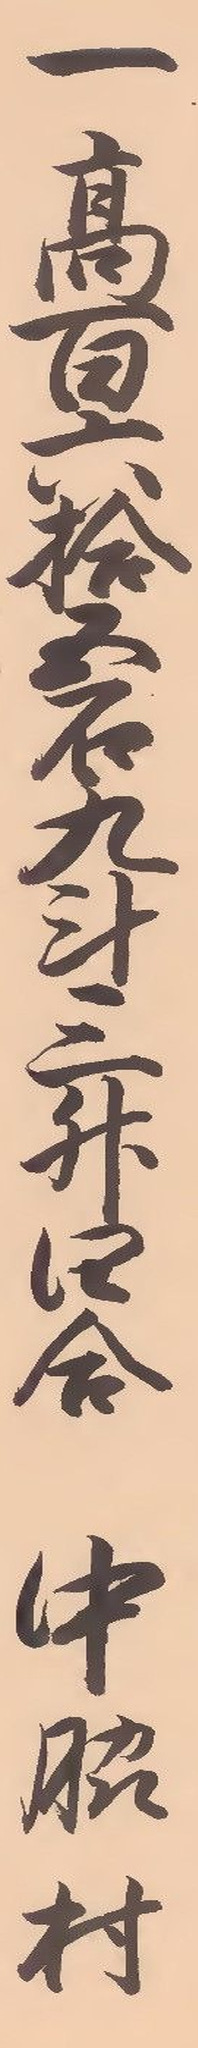一高百六拾五石九斗三升四合中脇村
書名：伊勢国郷帳
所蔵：国立公文書館 National Archives of Japan
